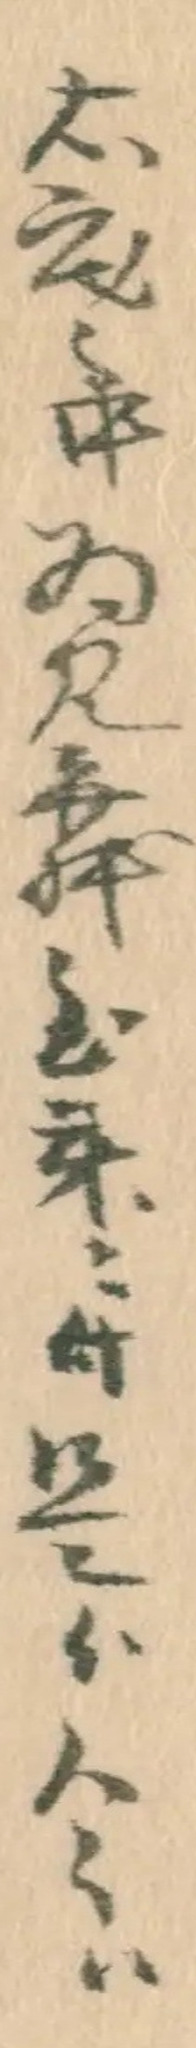右寒中為見舞到来ニ付是ゟ今日
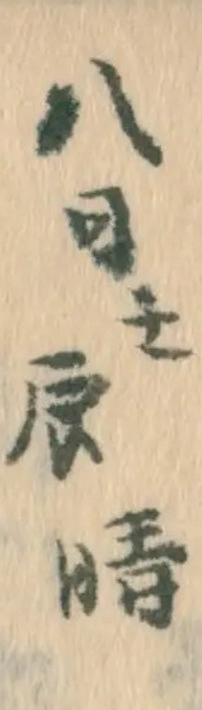八日壬辰晴
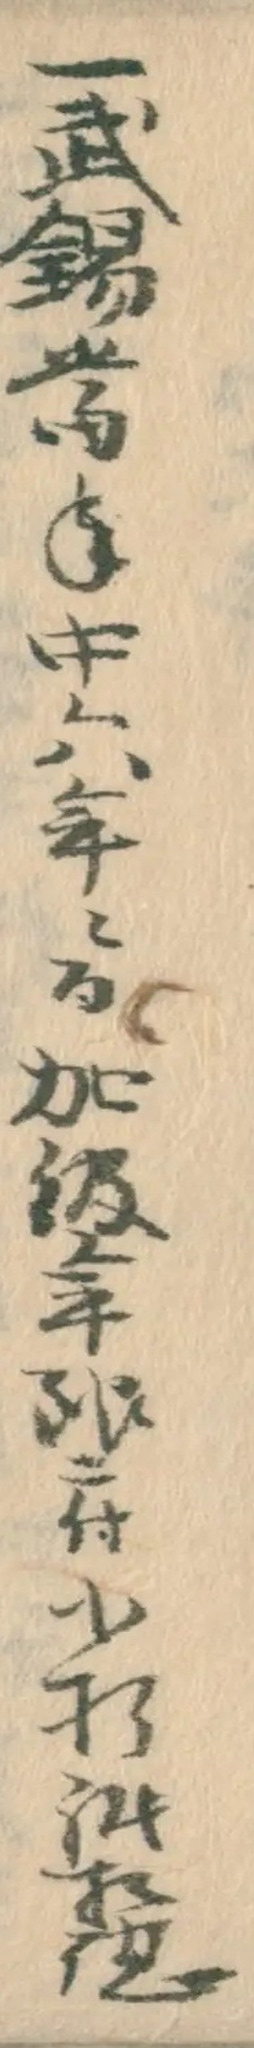一武錫当年中六年ニ而加級年限ニ付小折紙相認
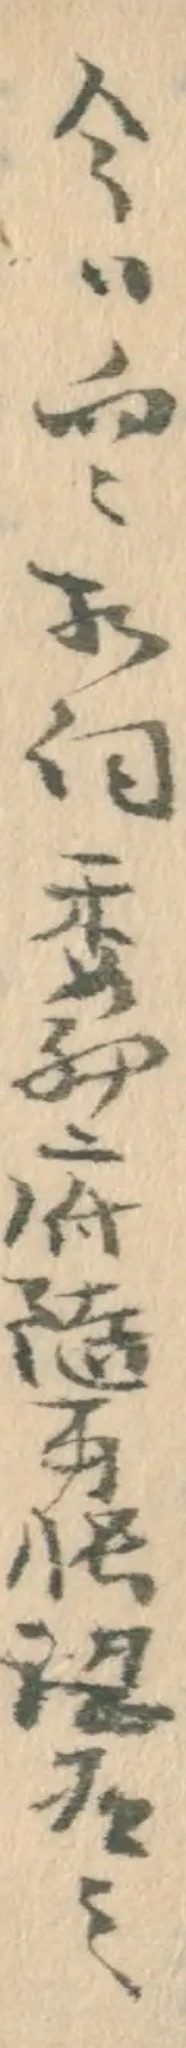今日向々相伺委細府随身帳認有之
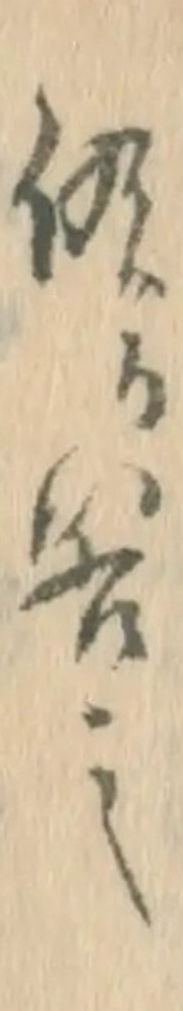仍而筈之

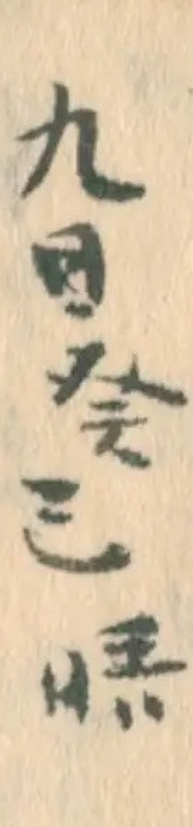九日癸巳晴
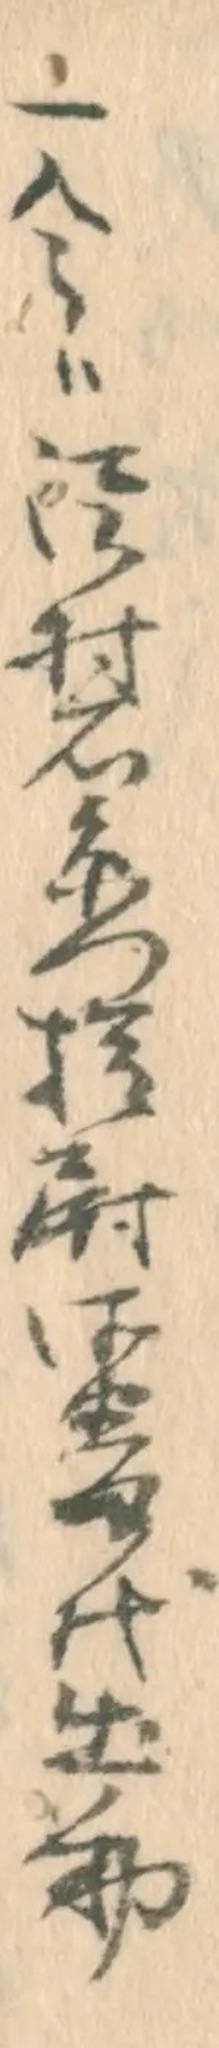一今日沢村右衛門権尉御番代出勤
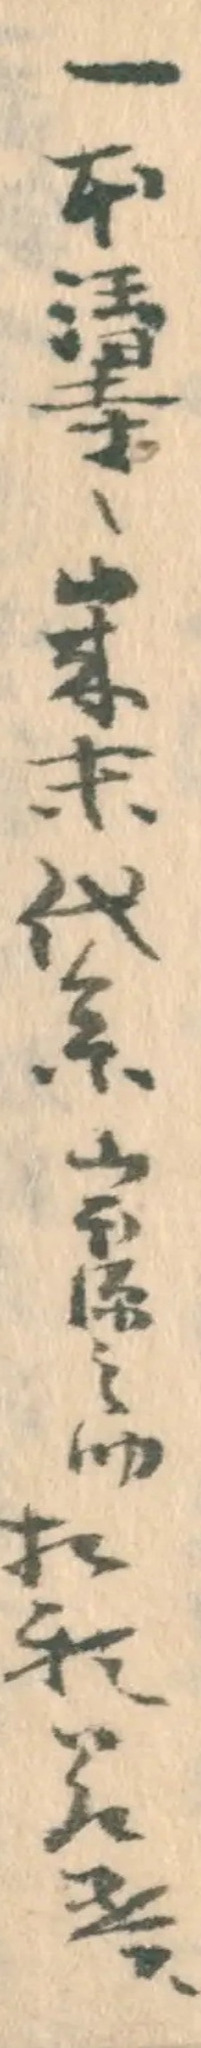一本清寺へ歳末代参山本源之助相頼差遣ス
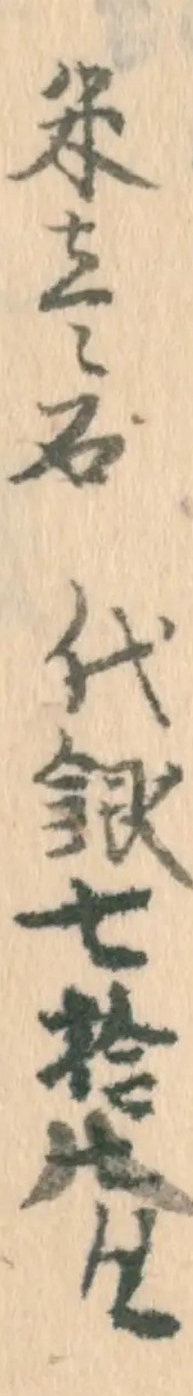米壱石代銀七拾八匁
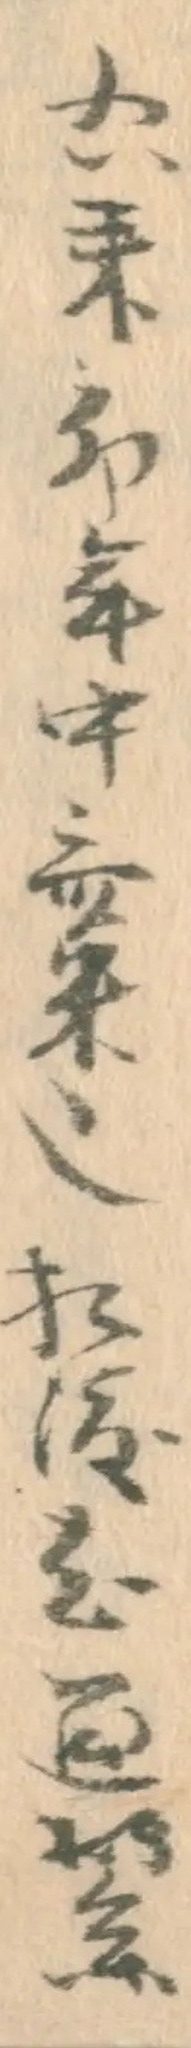右来卯年中斎米也相渡尤通持参
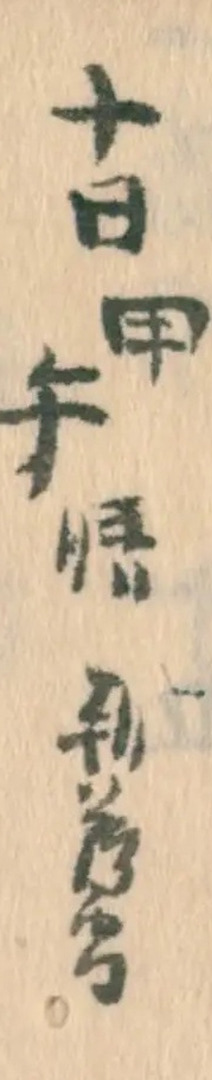十日甲午晴朝薄雪
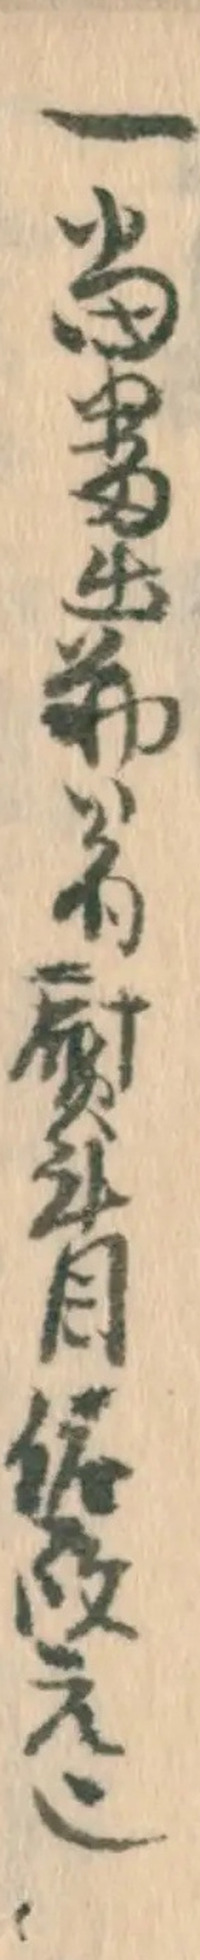一当番出勤着熨斗目御改元也
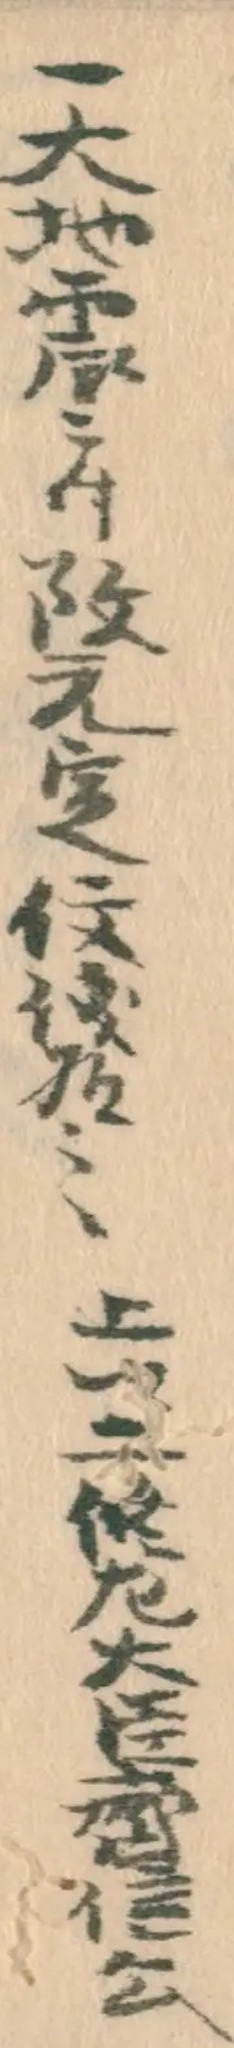一大地震ニ付改元定仗儀有之上ハ二条左大臣斉信公
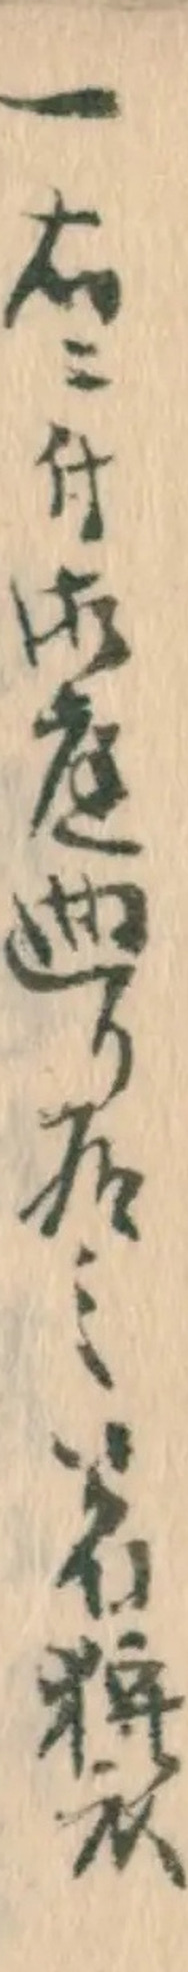一右ニ付御庭廻り有之着狩衣
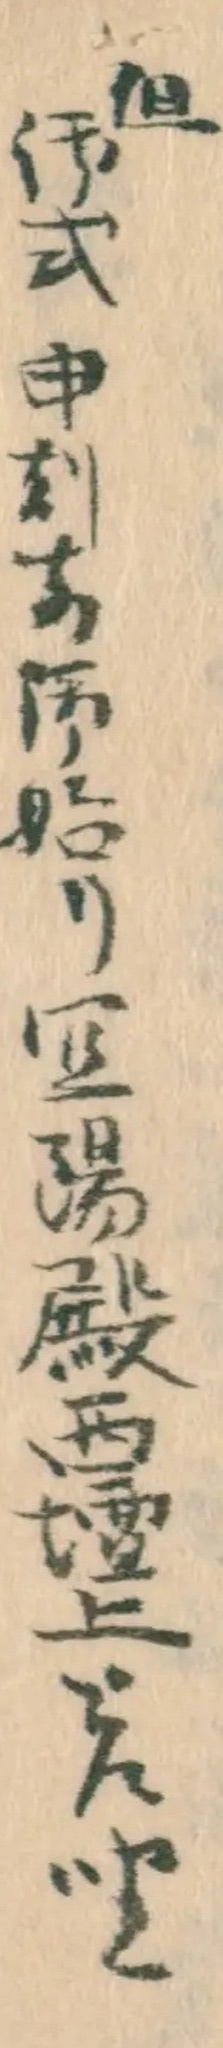但御式申刻前御始り宣陽殿西壇上着坐
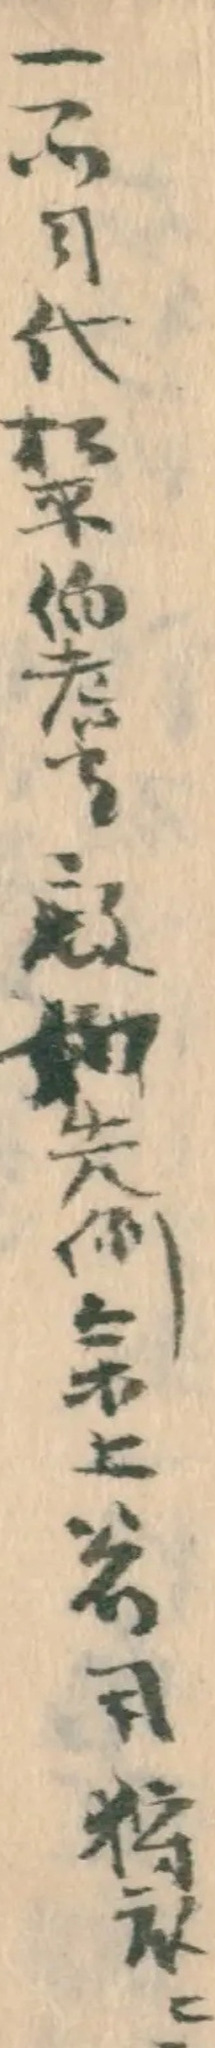一所司代松平伯耆守殿如先例参上着用狩衣ニ而
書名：禁裏御所御用日記. [131]
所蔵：国立国会図書館 National Diet Library, JAPAN
